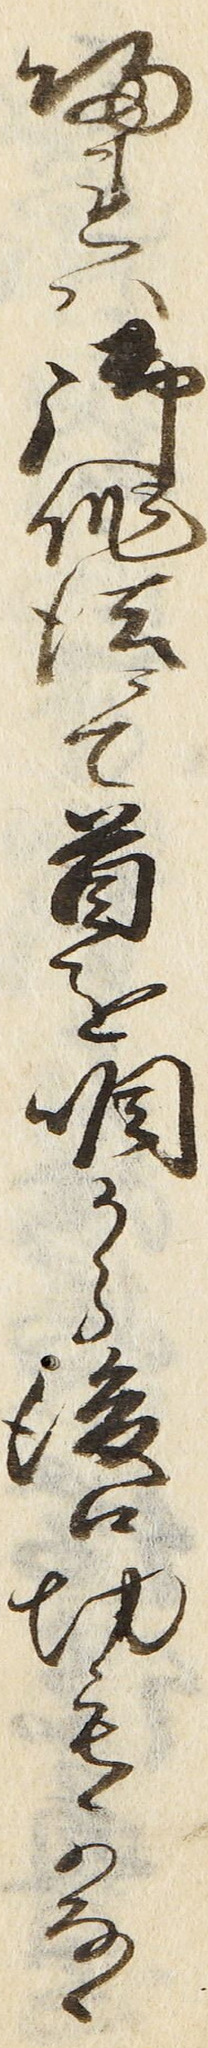帰れハ御作法ニて首を咽から後江切もかるゝ
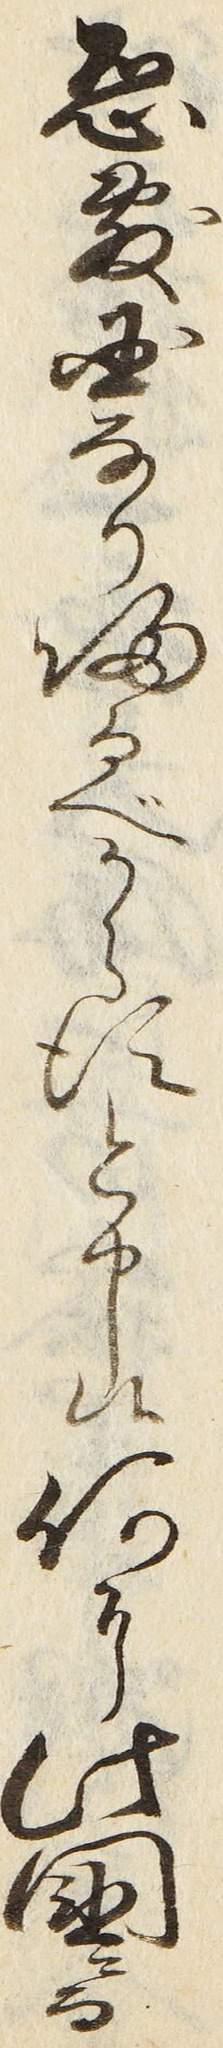恐敷国なり帰るべからすと申候何に此國ニ而
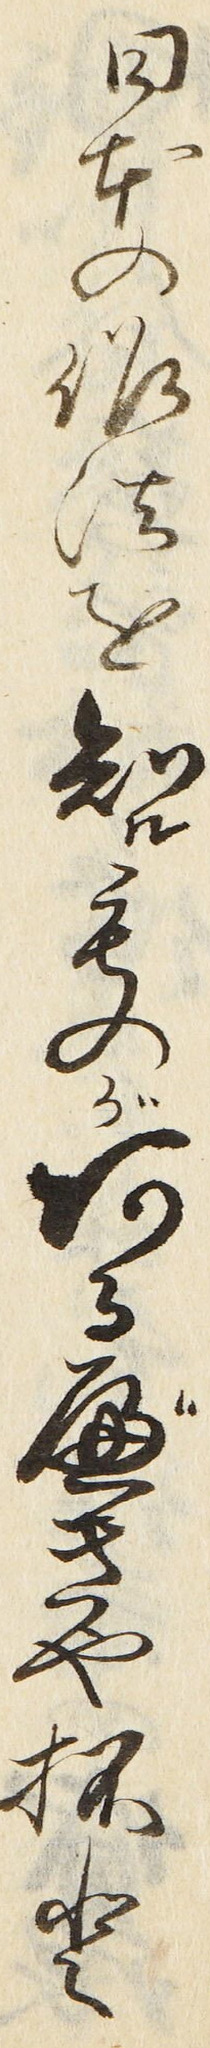日本の作法を知ルものがあるべきや抔と
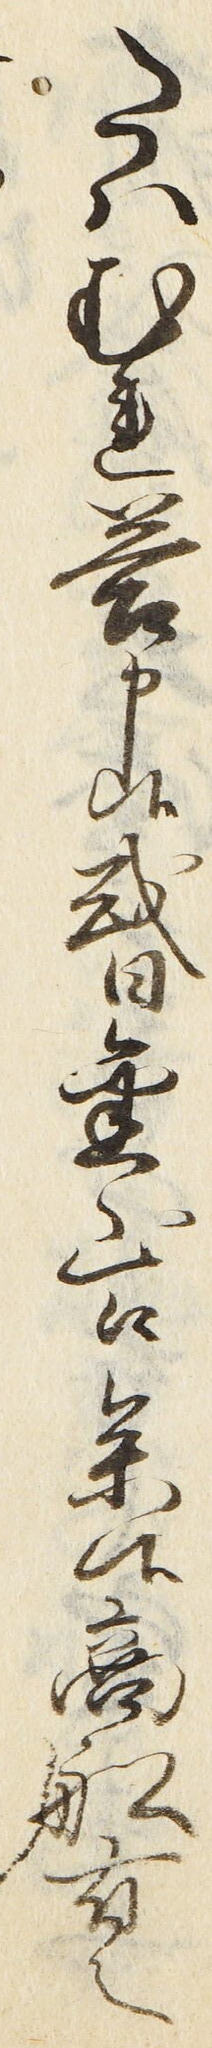たハむれ答申候或日金山江参候商舩有之
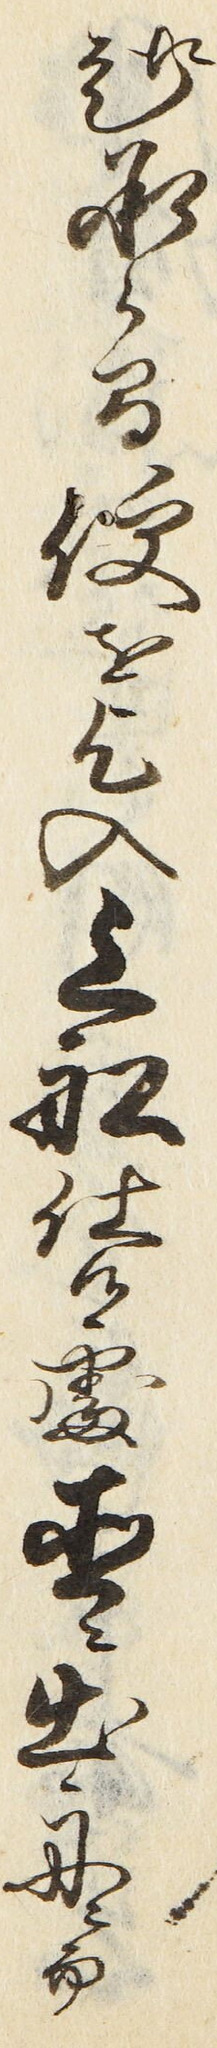趣承候間便を乞入上舩仕候處直ニ出舟ニ而
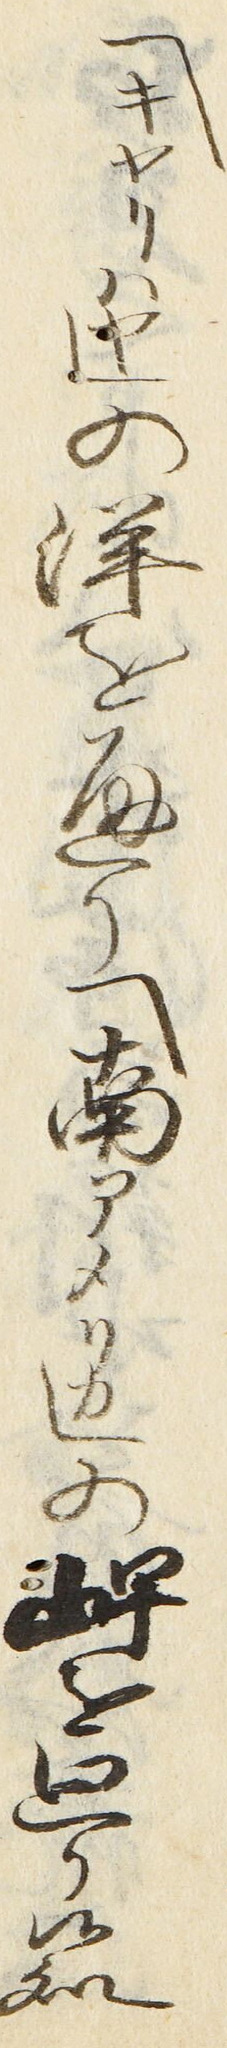「キヤリハヤ」の洋を通り「南アメリカ」の岬を廻り候処
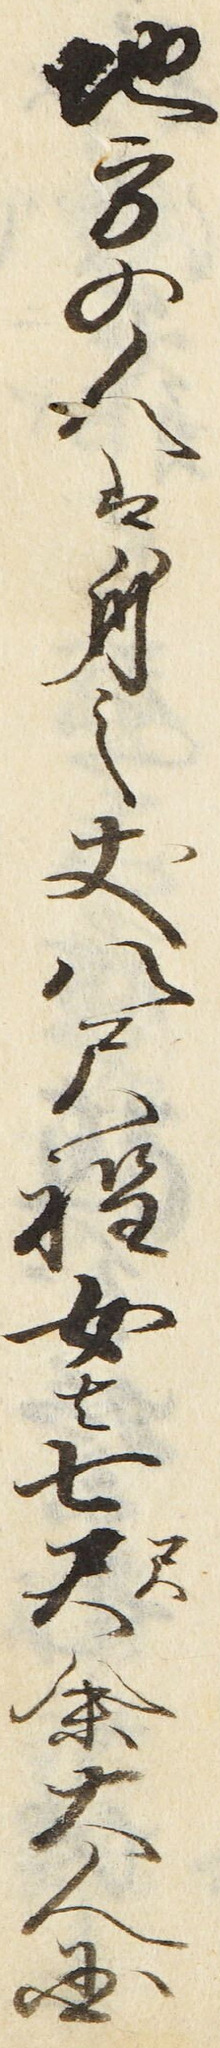地方の人は身之丈八尺程女者七尺余大人国
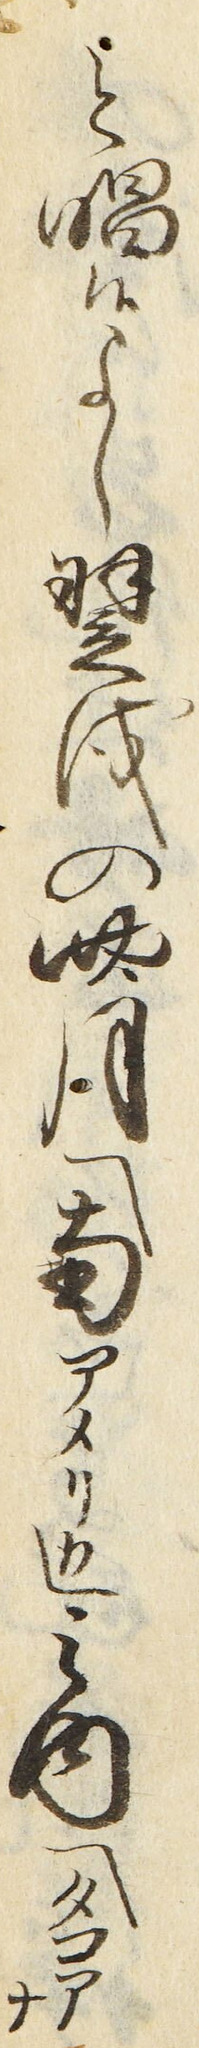と唱候よし翌戌の四月「南アメリカ」之内「タコアナ

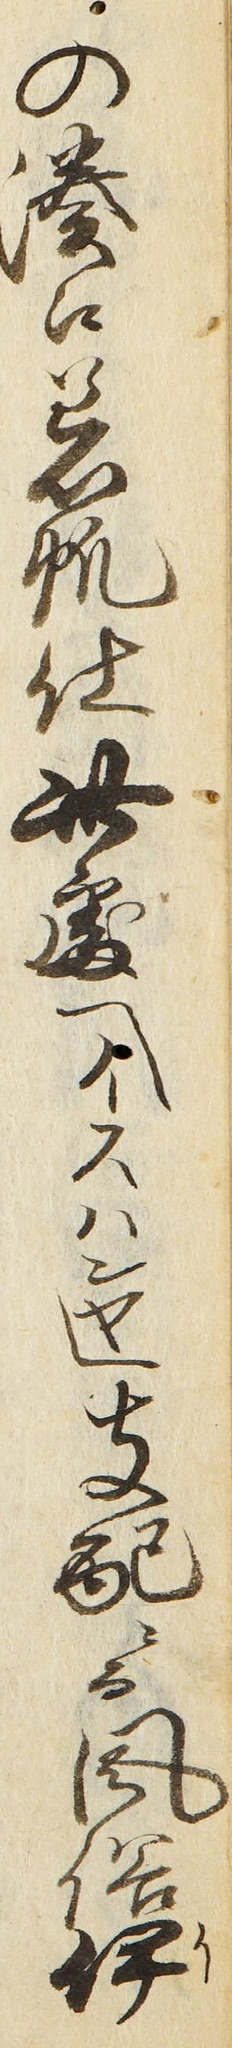の湊江着帆仕此處「イスハンヤ」支配ニ而風俗伊
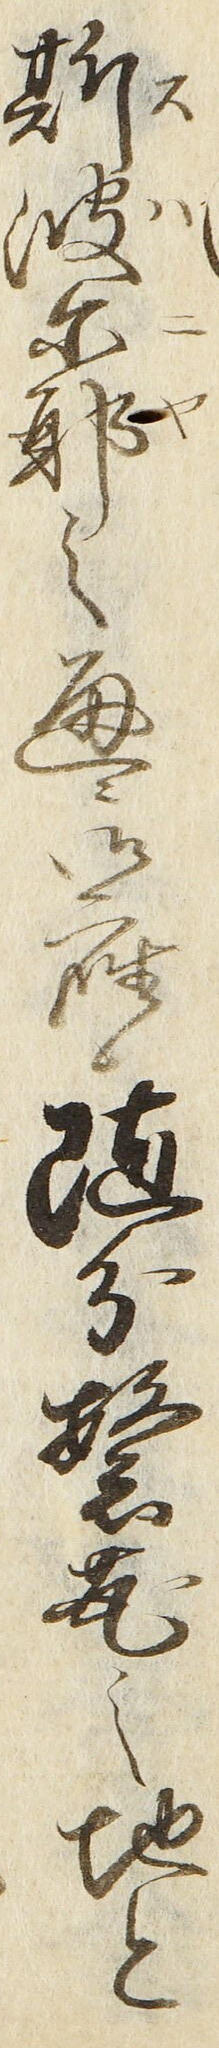斯波尓耶之通ニ御座候随分繁花之地と
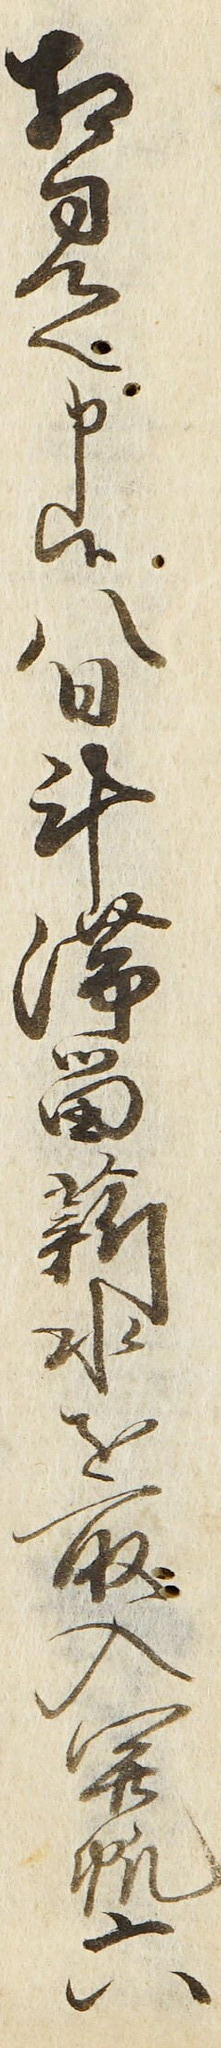相見へ申候八日斗滞留薪水を取入開帆六
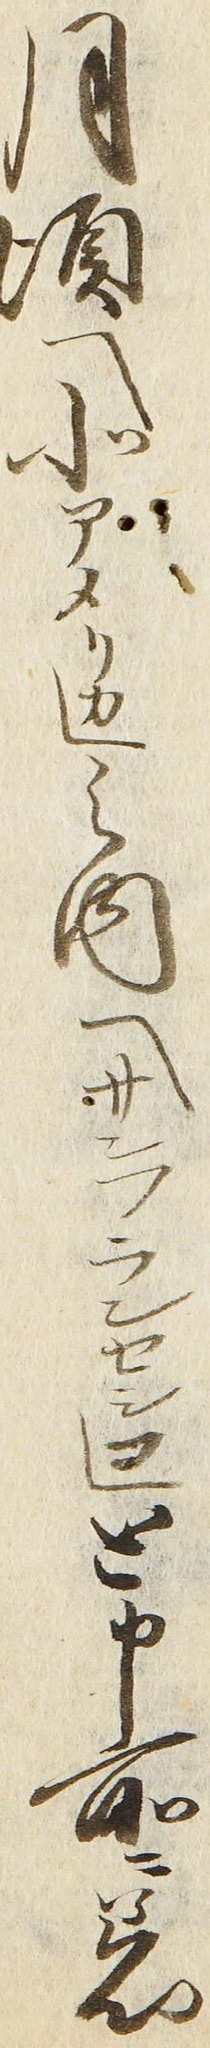月頃「北アメリカ」之内「サンフランセシコ」と申所ニ着
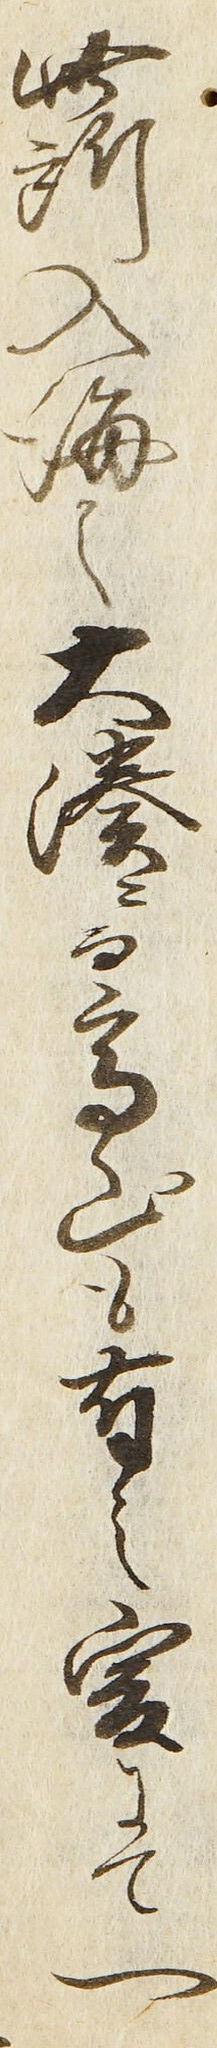此所入海之大湊ニ而高山も有之爰にて一
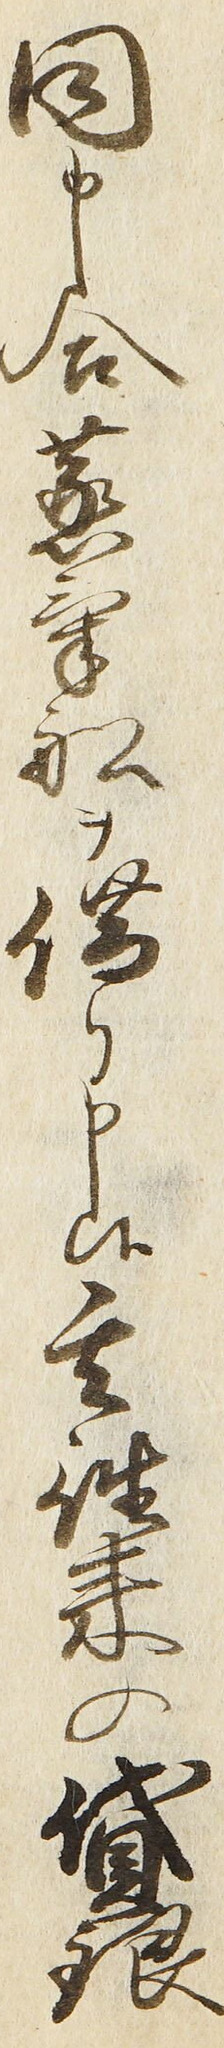同申合蒸氣舩ヲ借り申候其往来の貸銀
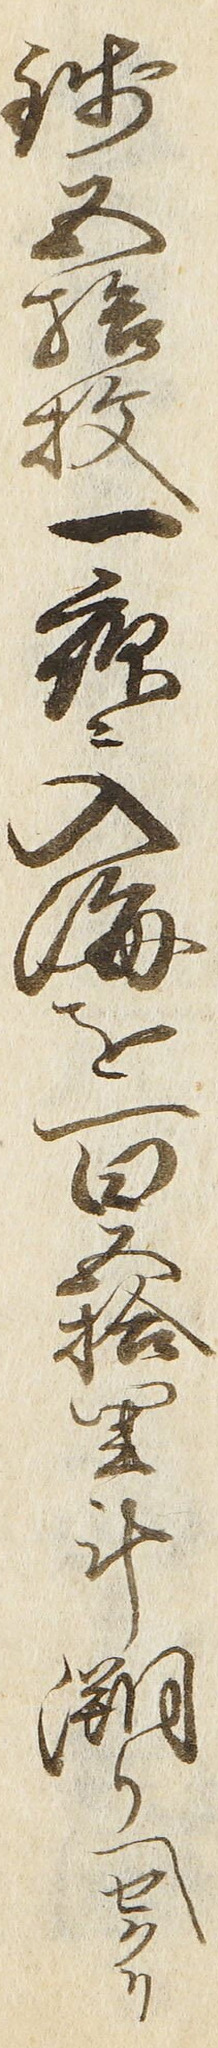銭五拾枚一夜ニ入海を百五拾里斗遡り「セクリ
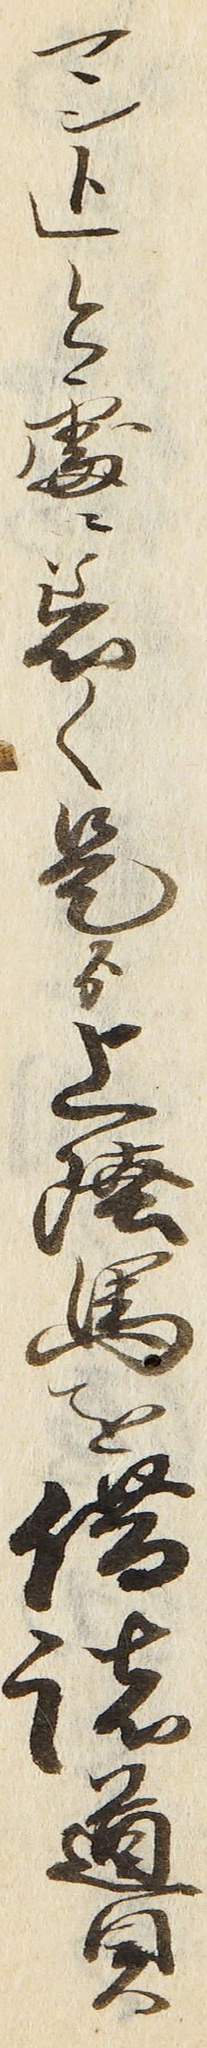マント」と處ニ着く是ゟ上陸馬を借諸道具
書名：漂客談寄
